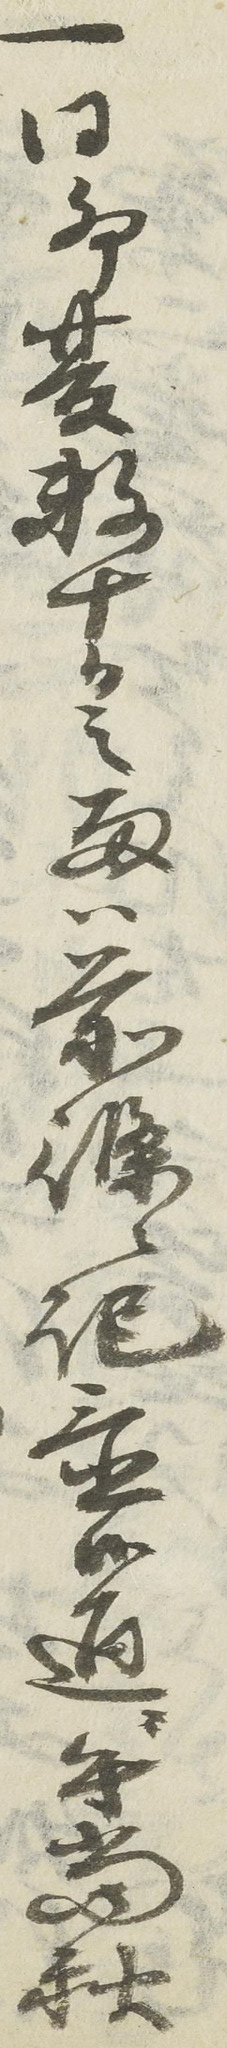一同卯夏数十日之出雨は前条ニ而記置候通ニ付当秋
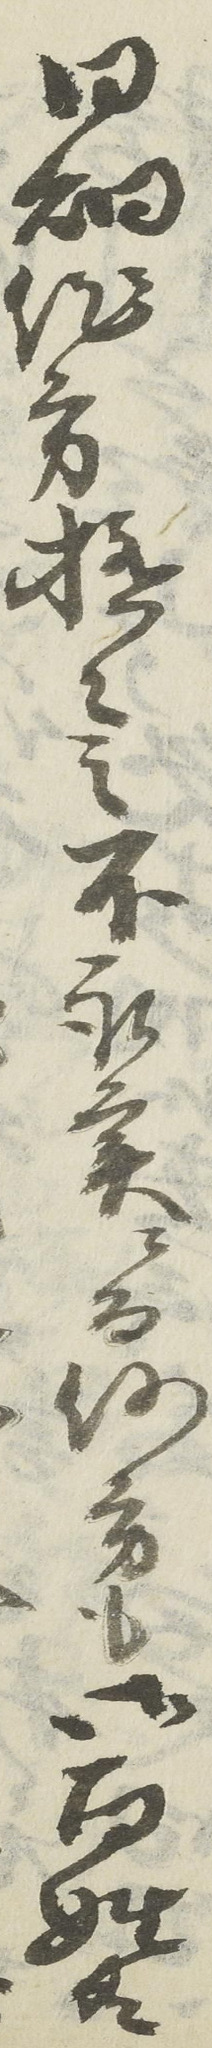田畑作方極々之不取実ニ而何方も御百姓共
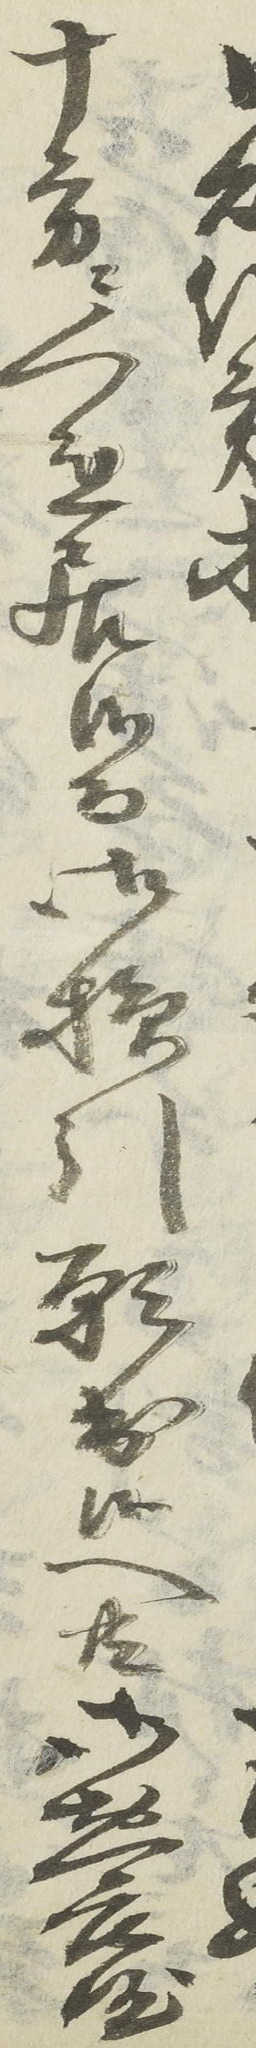十方ニくれ居候而御損引願出候へ共御惣庄屋
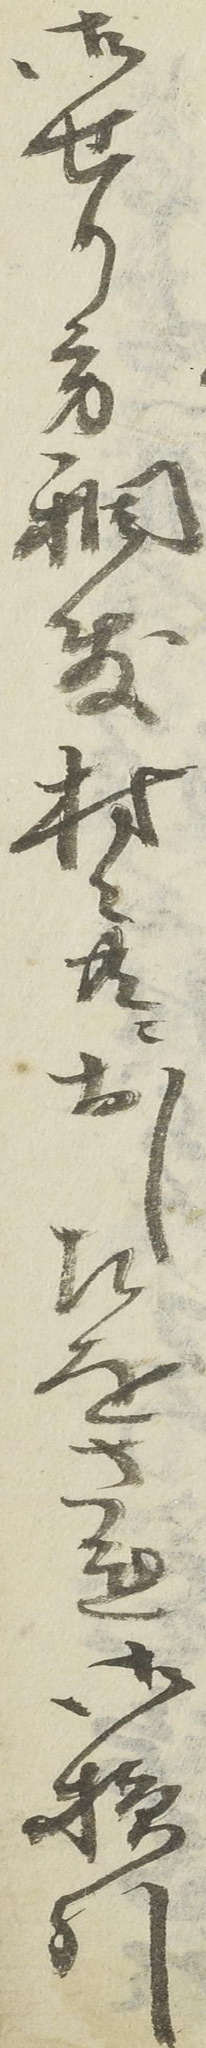御せり方稠敷村々共ニおしたおされ御損引

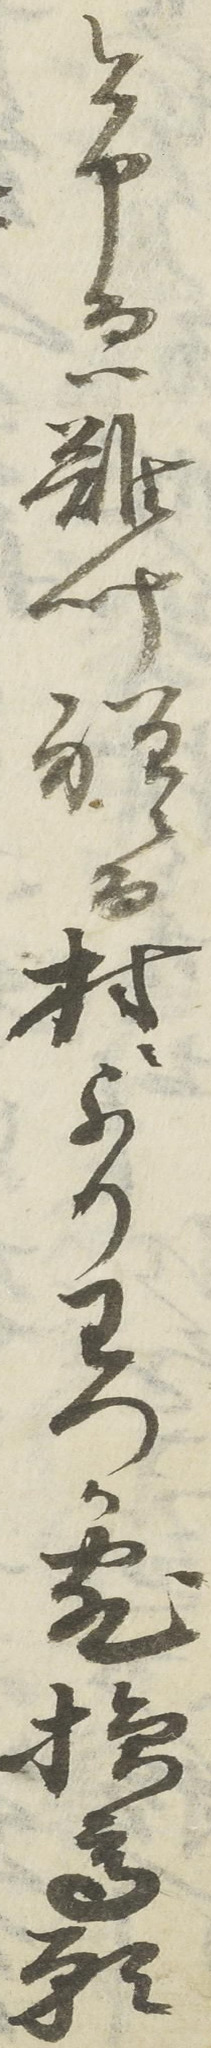と申而は難叶程ニ而村よりわつか宛損高願
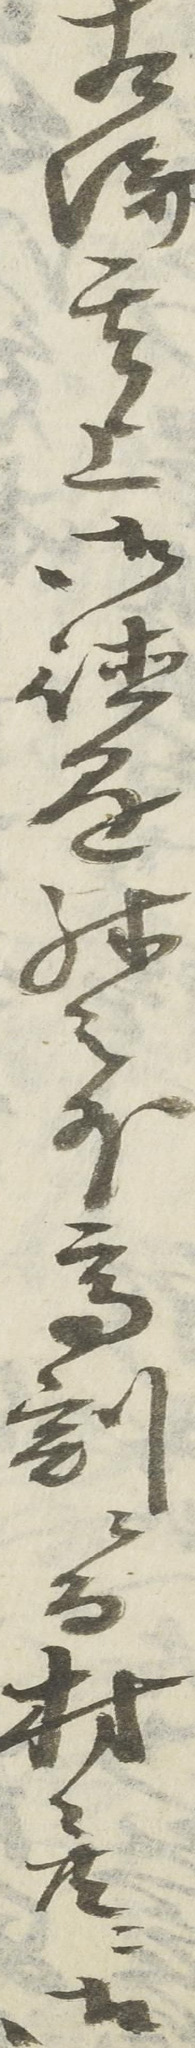相済其上御徳懸殊之外高割ニ而村々共ニ御
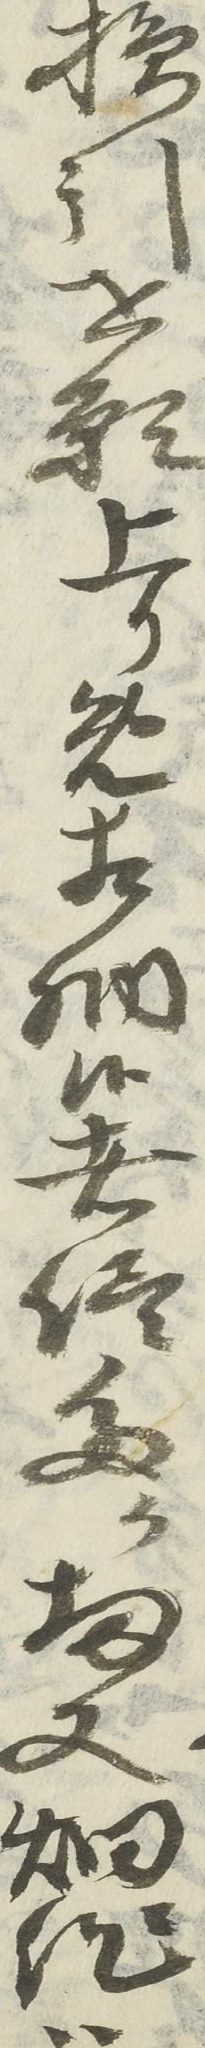損引を願上り免相納候者儘多ク扨又畑作は
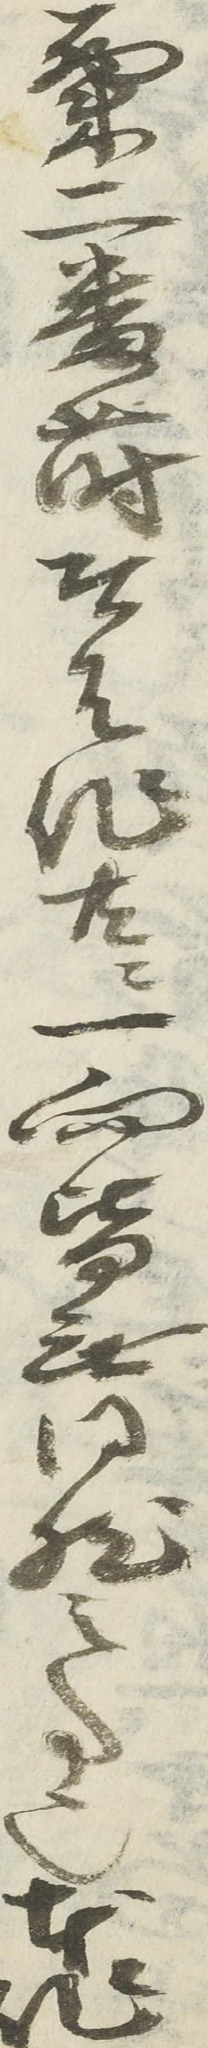粟二番蒔そは作共ニ一向皆無同然の事也本作
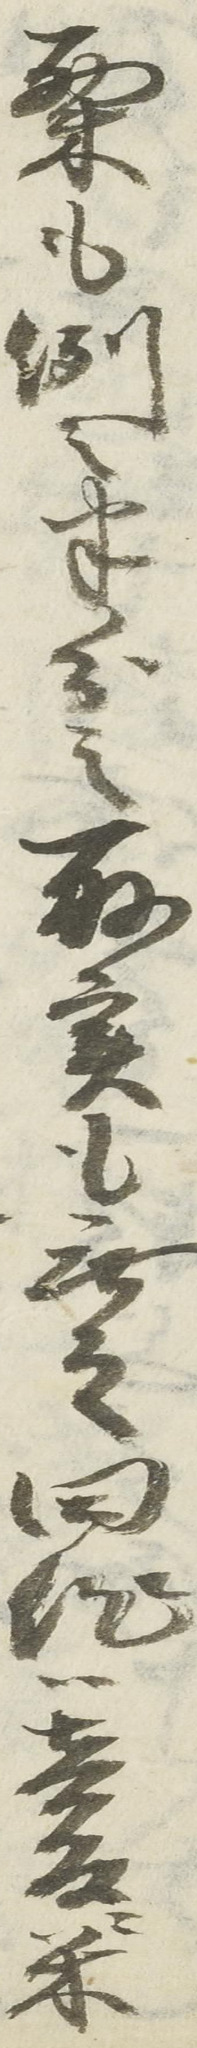粟も例之半分之取実も無之同作は壱反ニ米
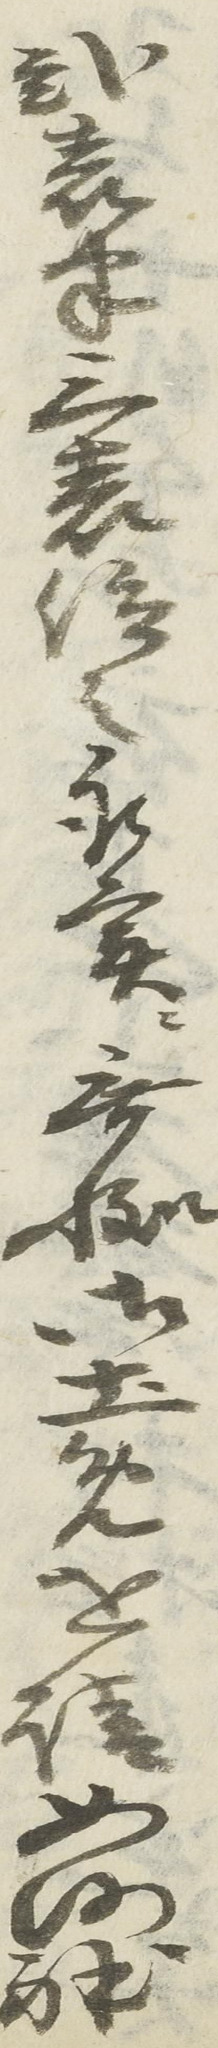弐表半三表依之取実ニ無拠御土免を請如何躰
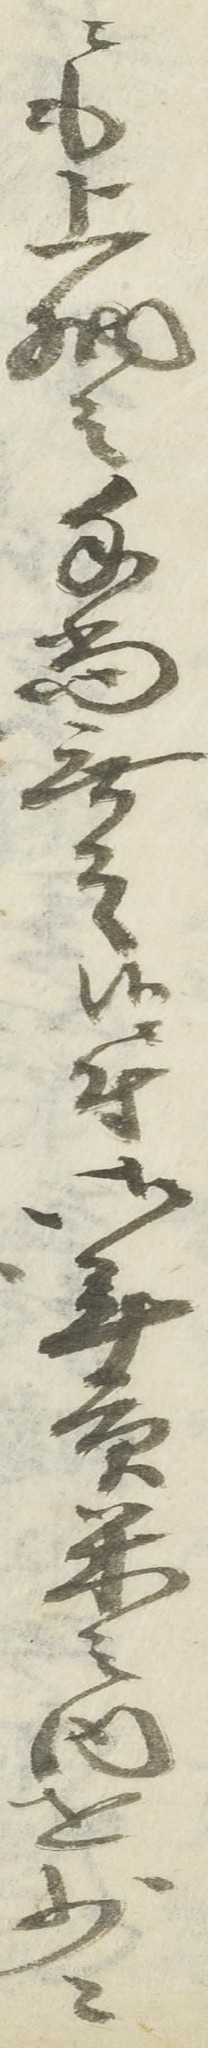ニも上納之手当無之候ニ付御年貢米之内を少々
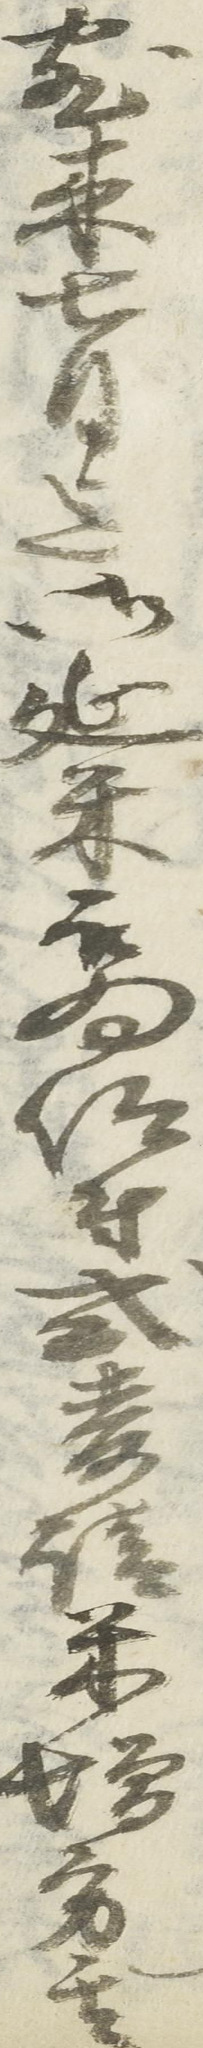宛来七月迄御延米被為仰付弐表請米増方其
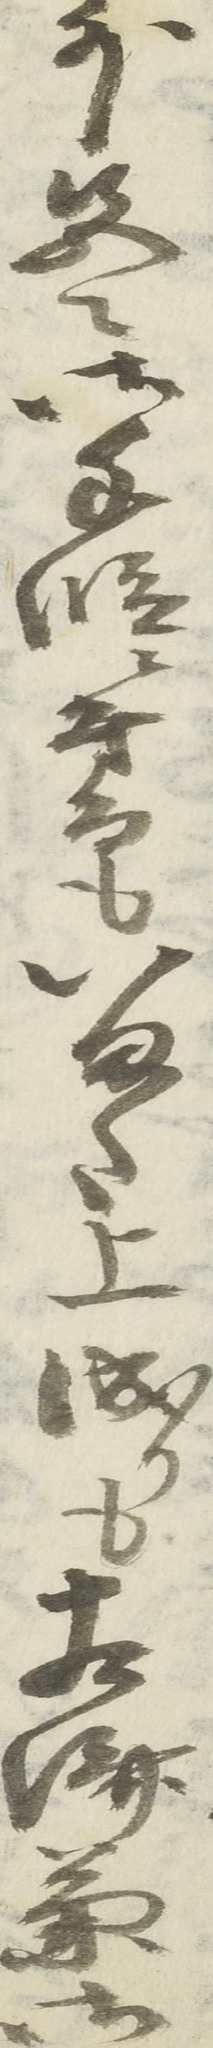外色々御手段ニ付而もいまた上成りも相済兼御
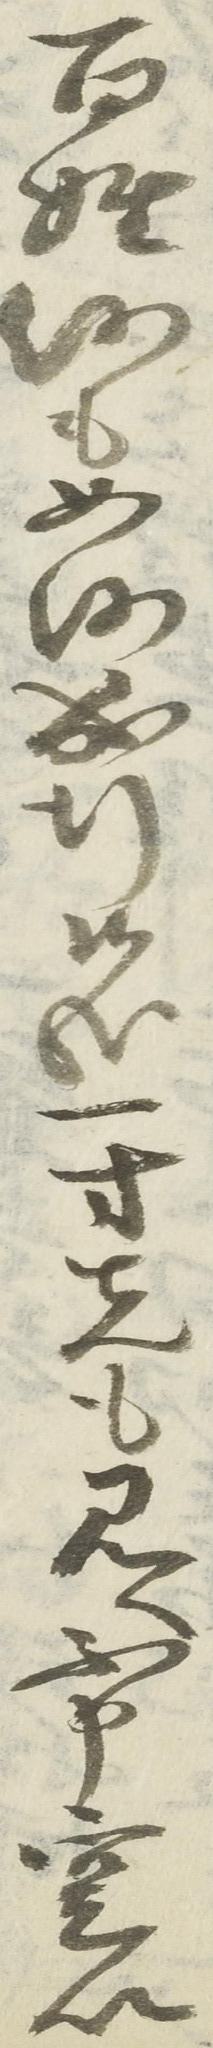百姓何も如何成行候哉一寸先も見へ不申寔以
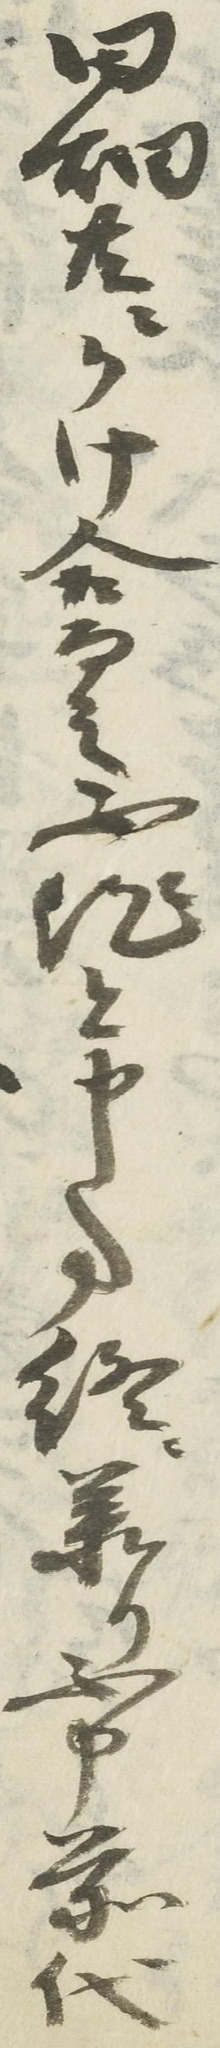田畑共ニかけ合而之不作と申事終ニ参り不申前代
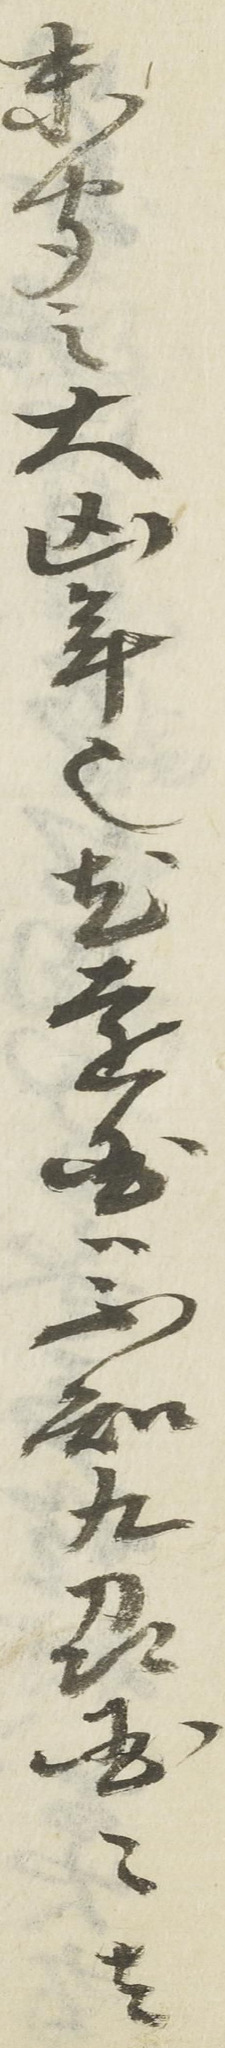未聞之大凶年也尤遠国は不知九州国々は
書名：後見笑
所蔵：東京大学地震研究所図書室 Earthquake Research Institute Library, The University of Tokyo, JAPAN
